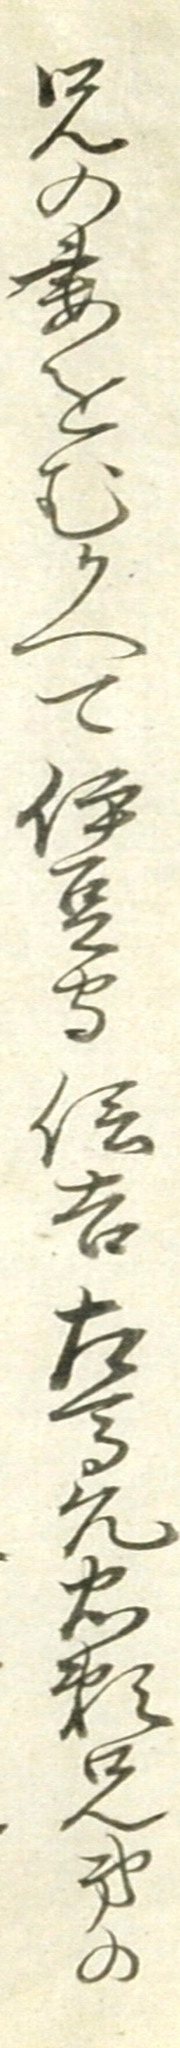兄の妻をむかへて伊豆守信吉左馬允忠頼兄弟の
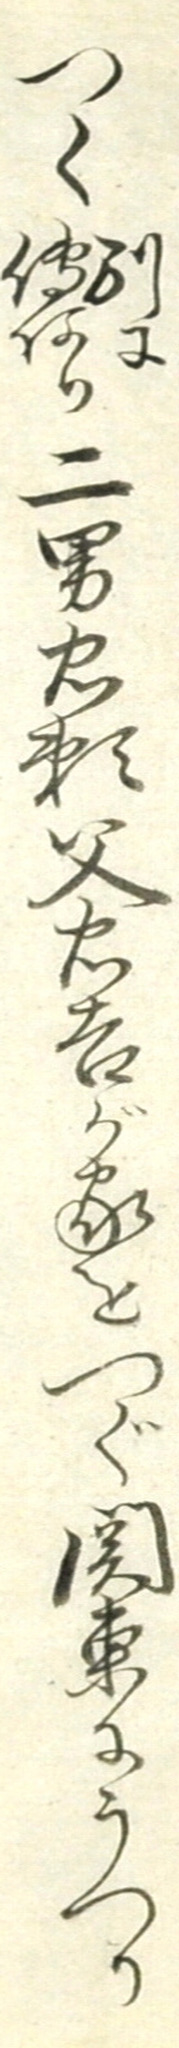つく別に伝あり二男忠頼父忠吉が家をつぐ関東にうつり
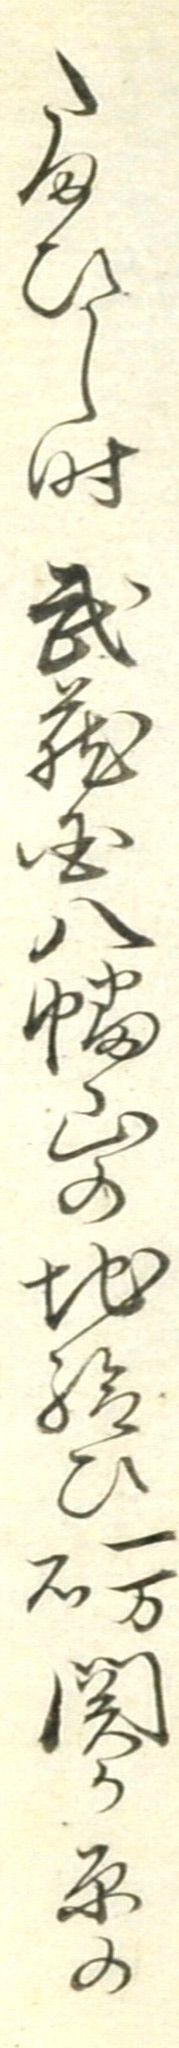たまひし時武蔵国八幡山の地給ひ一万石関ゕ原の
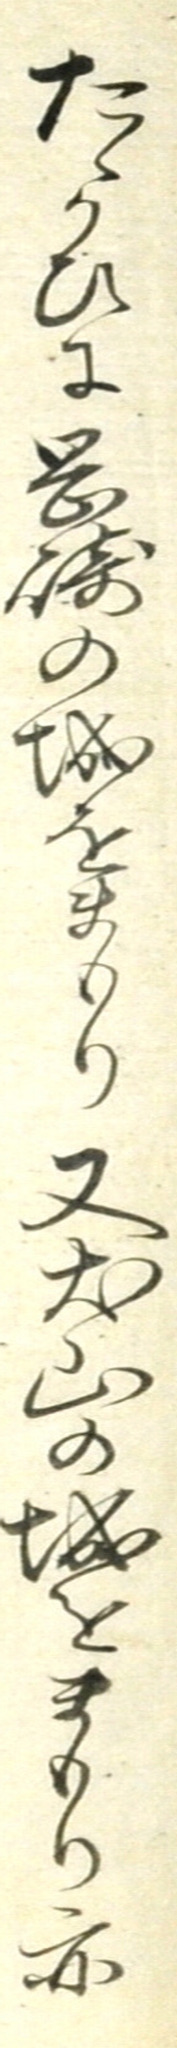たゝかひに岡崎の城をまもり又犬山の城をまもり亦
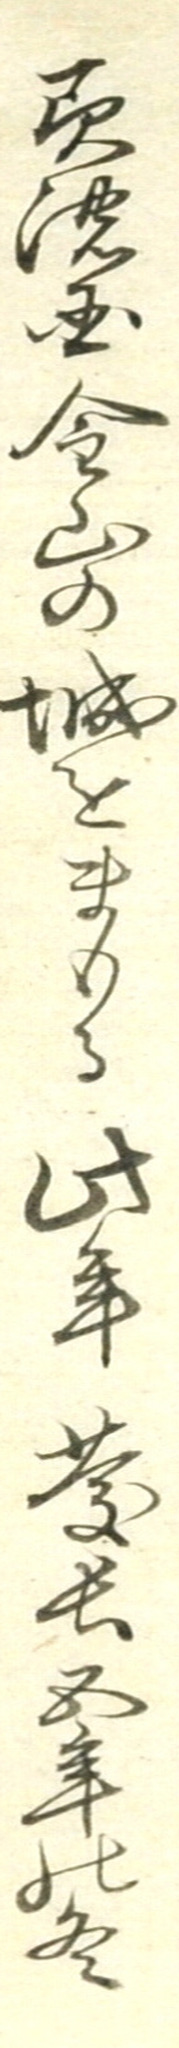美濃国金山の城をまもる此年慶長五年の冬
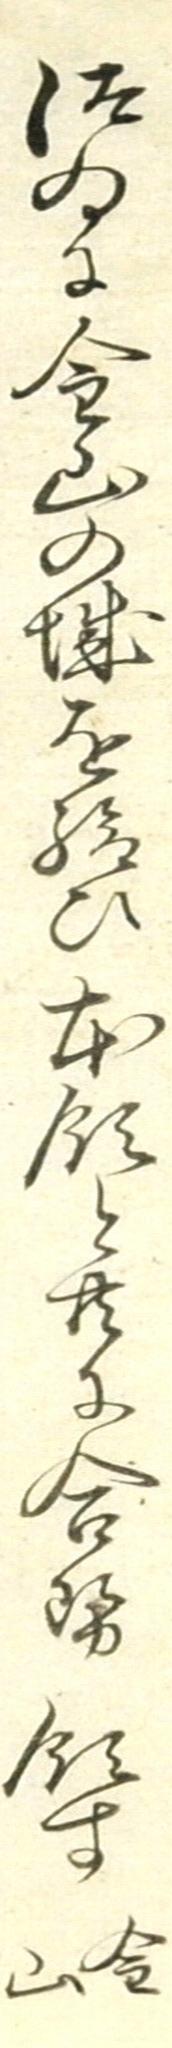つゐに金山の城を給ひ本領と共に合勢領す金山
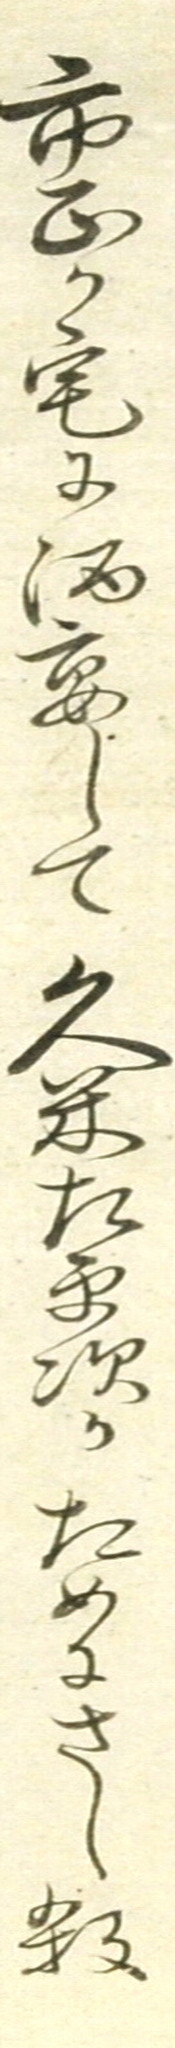市正か宅に酒宴して久米佐平次かためにさし殺
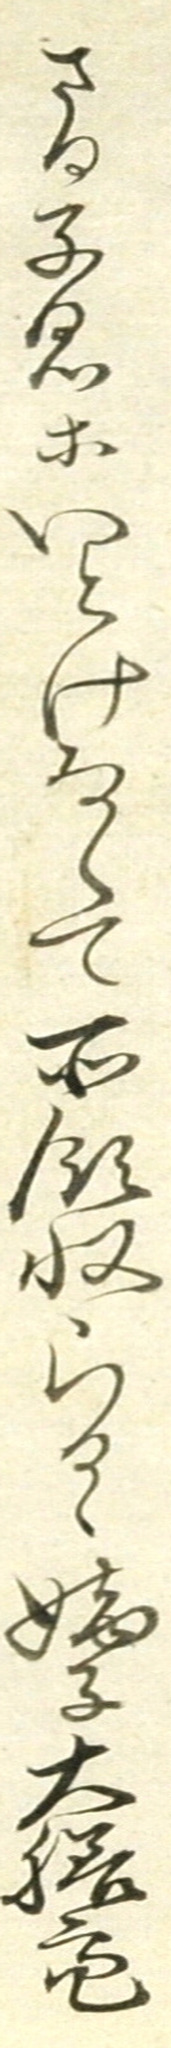さる子息等いとけなくて所領収らるゝ嫡子大膳色
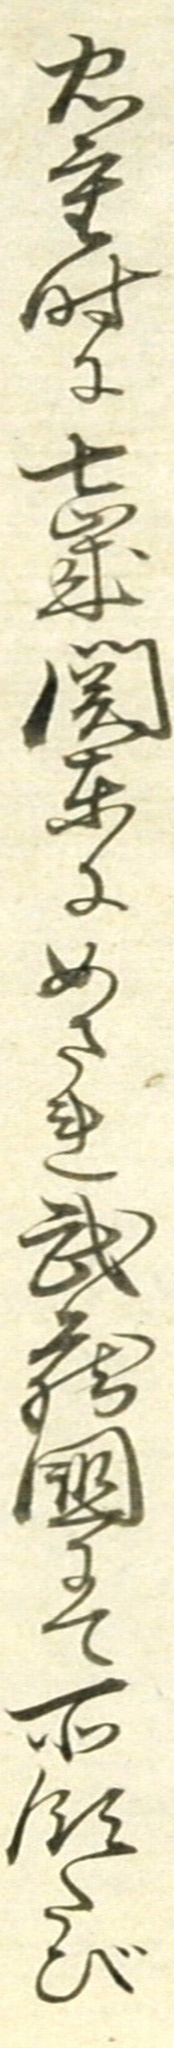忠重時に七歳関東にめされ武蔵国にて所領たび

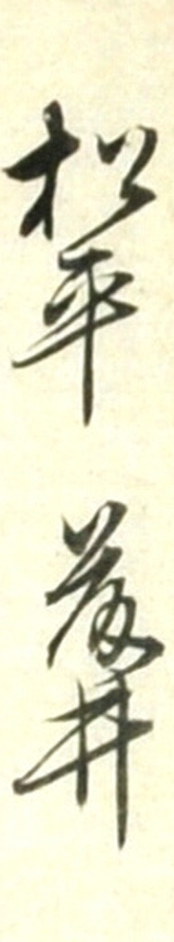松平藤井
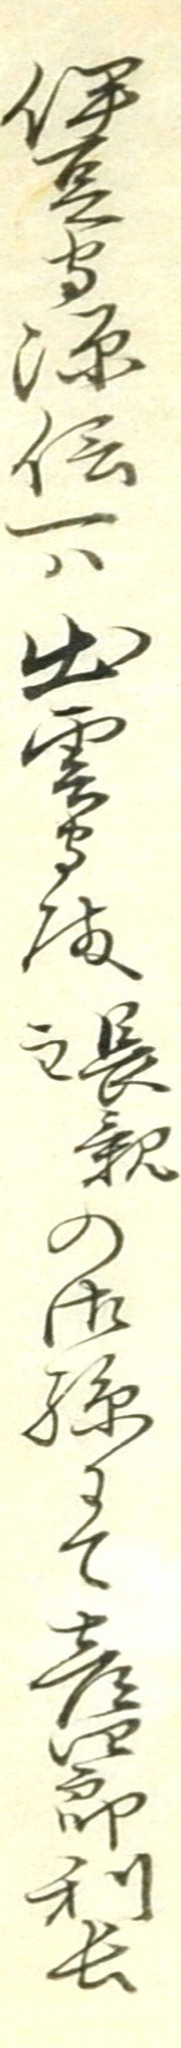伊豆守源信一は出雲守殿長親主の御孫にて彦四郎利長
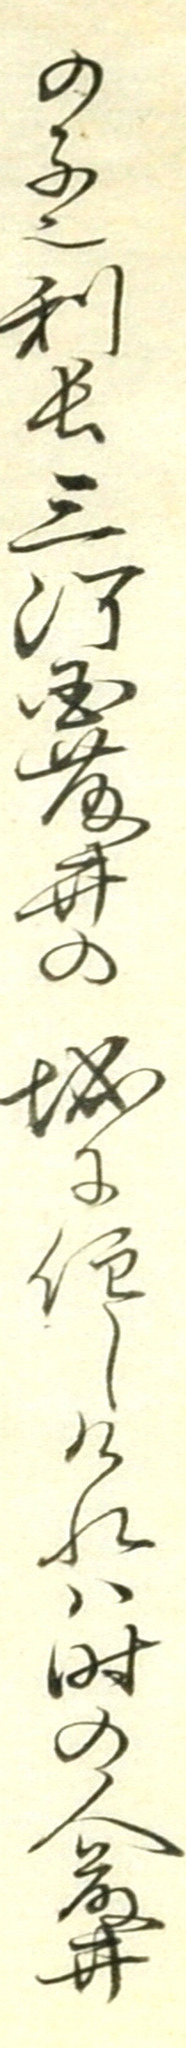の子也利長三河国藤井の城に住しけれは時の人藤井
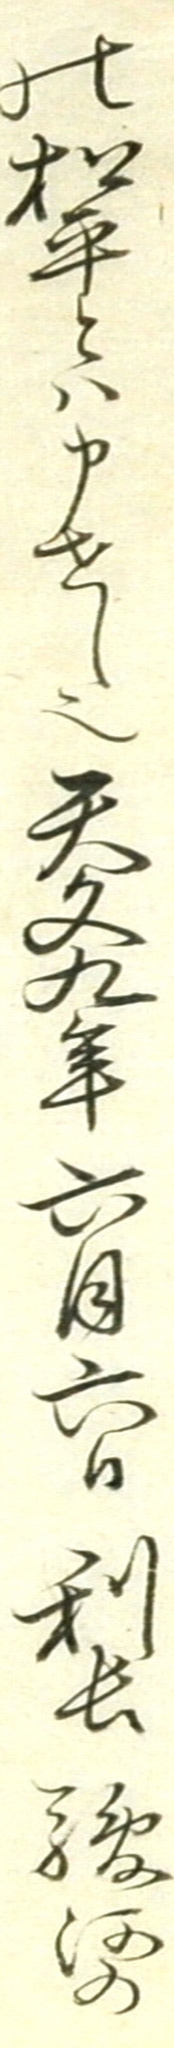の松平とは申せし也天文九年六月六日利長駿河の
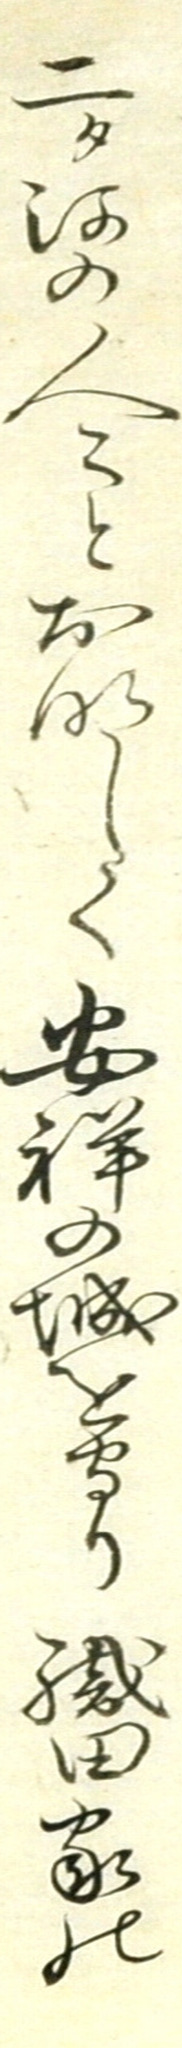二河の人々とおなしく安祥の城を守り織田家の
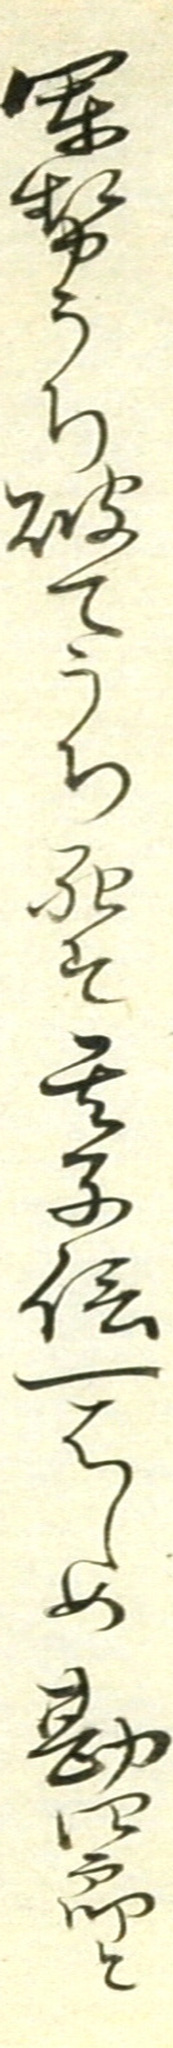軍勢うち破てうち死す其子信一はしめ勘四郎と
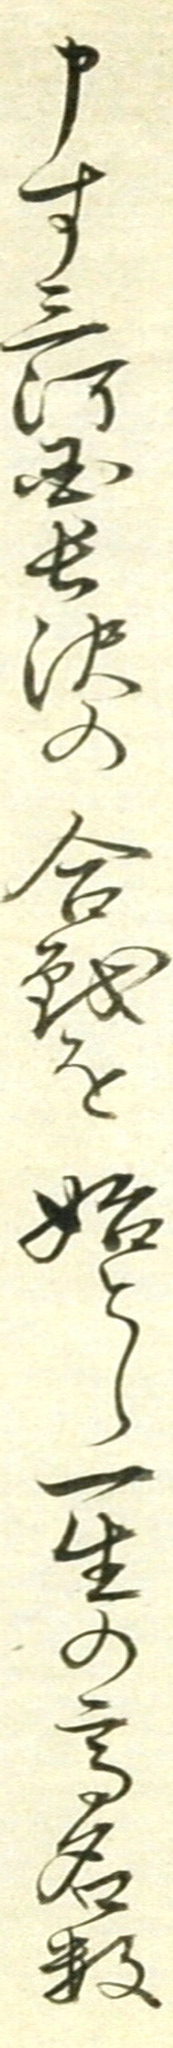申す三河国長沢の合戦を始とし一生の高名数
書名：藩翰譜（二・三）
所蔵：伊那市立高遠町図書館・合同会社AMANE
